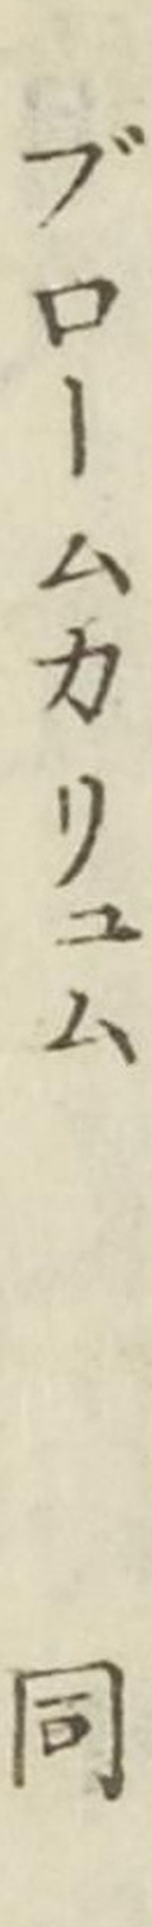ブロームカリュム同
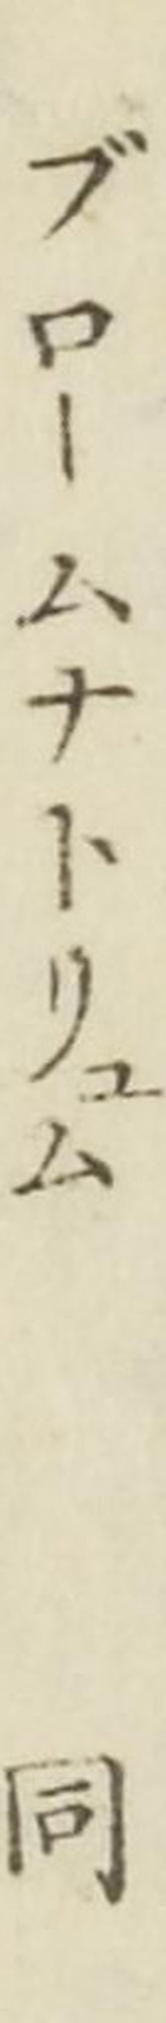ブロームナトリュム同
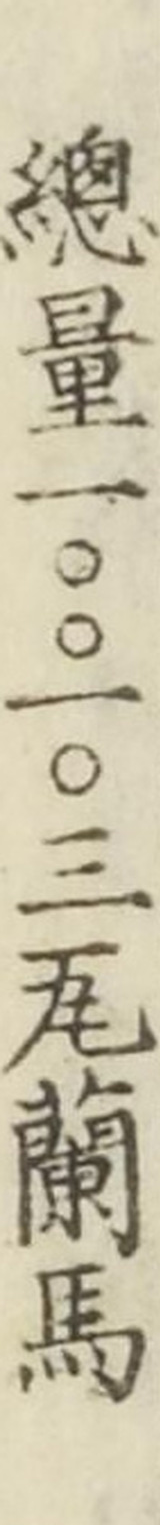総量一〇〇一〇三瓦蘭馬
